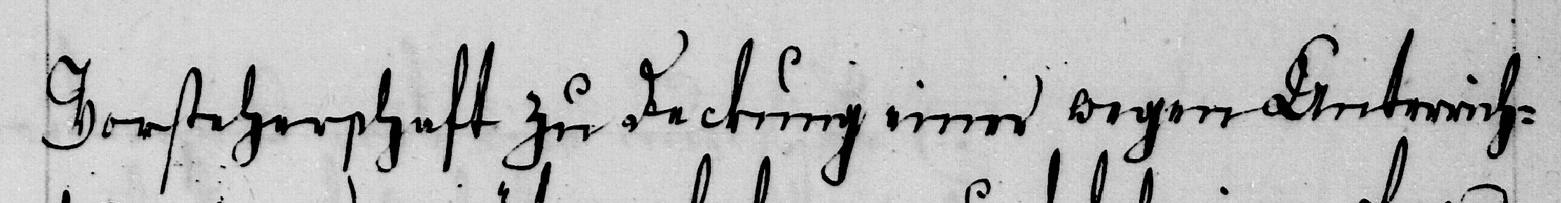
Vorsteherschaft zu Deckung einer wegen Unterrich¬
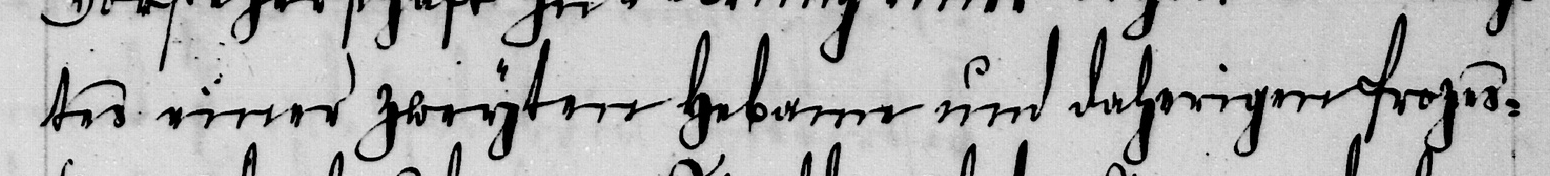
tes einer zweyten Hebame und daherigen Prozes¬
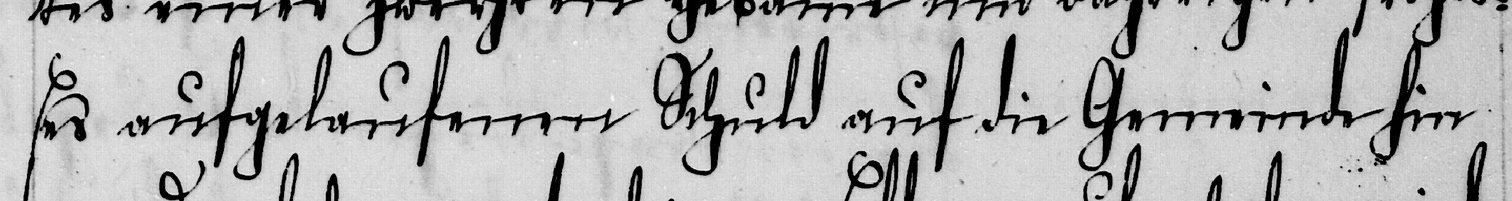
ses aufgelaufenen Schuld auf die Gemeinde hin
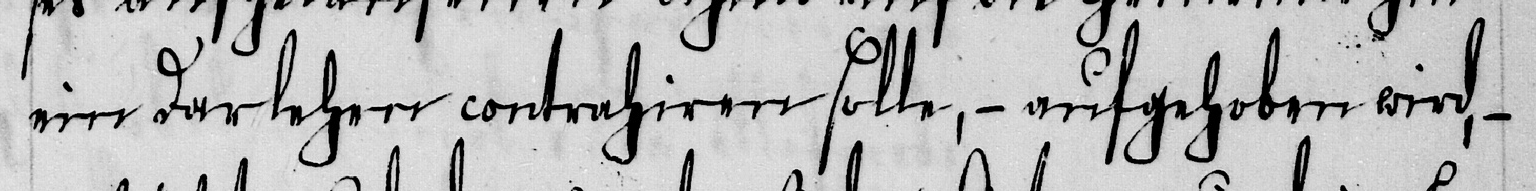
ein Darlehen contrahiren solle, – aufgehoben wird,
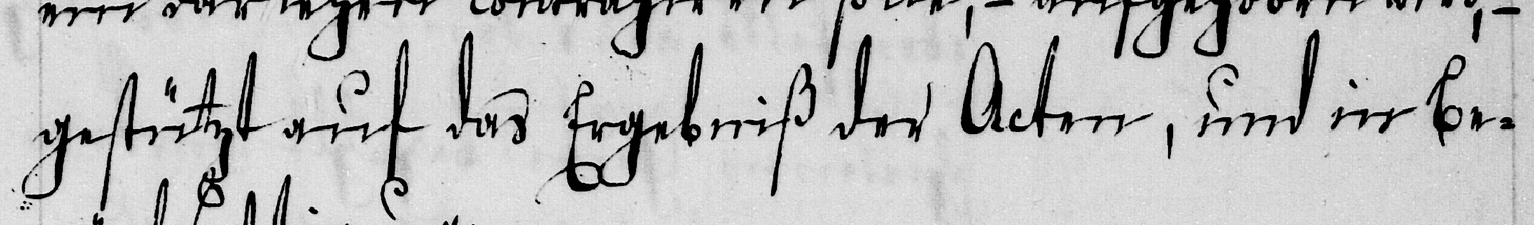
gestützt auf das Ergebniß der Acten, und in Be¬
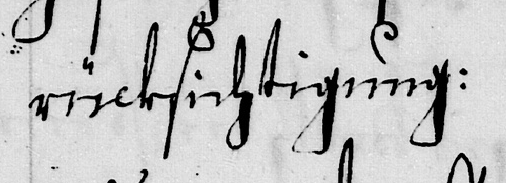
rücksichtigung:
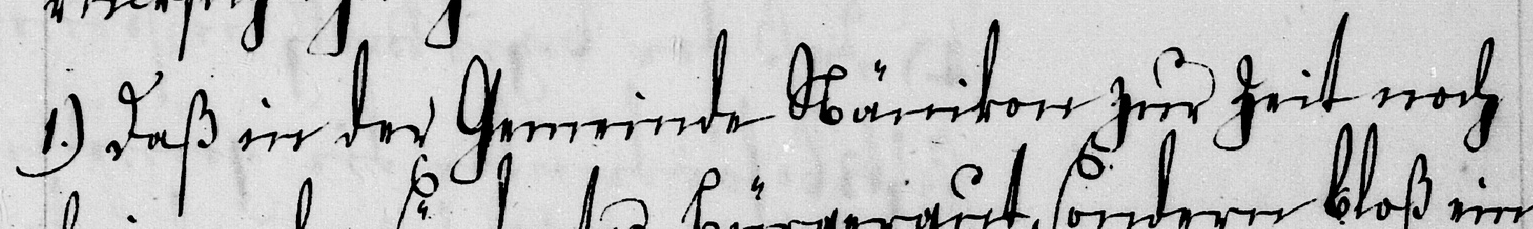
1.) Daß in der Gemeinde Nänikon zur Zeit noch
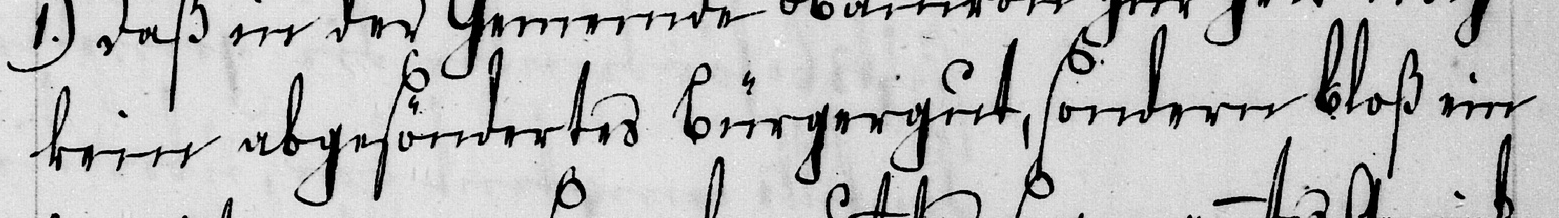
kein abgesöndertes Bürgergut, sondern bloß ein
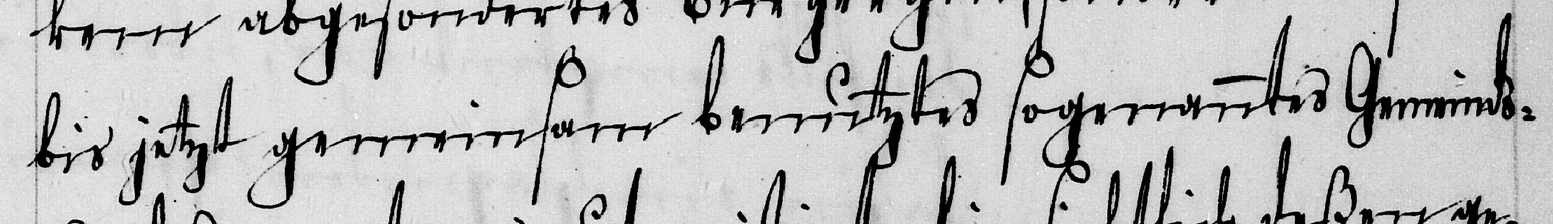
bis jetzt gemeinsam benutztes sogenanntes Gemeinds-
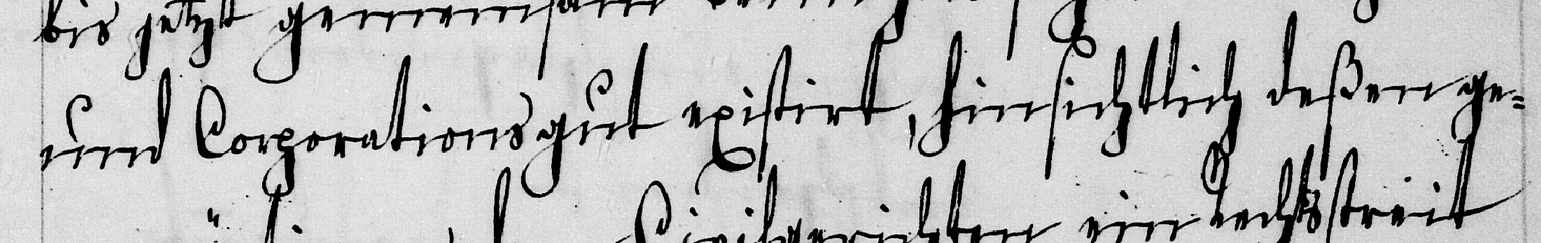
und Corporationsgut existirt, hinsichtlich deßen ge¬
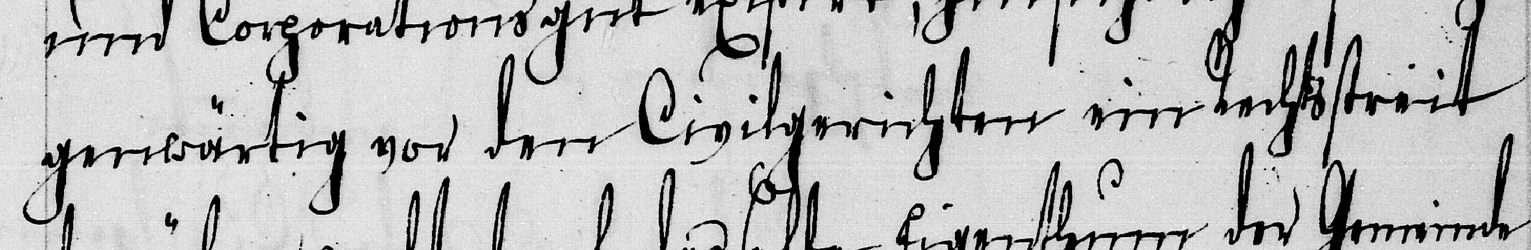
genwärtig vor den Civilgerichten ein Rechtsstreit
